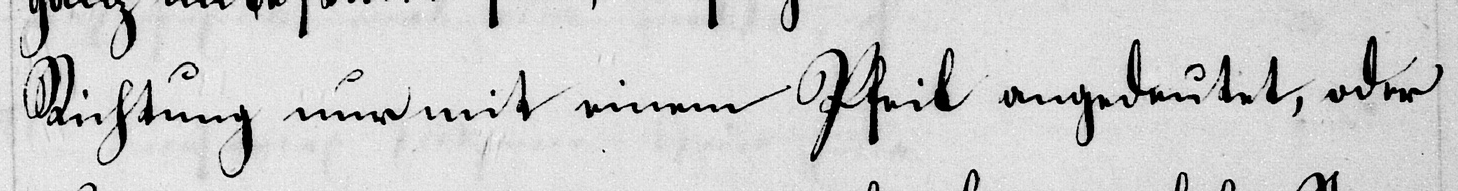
Richtung nur mit einem Pfeil angedeutet, oder
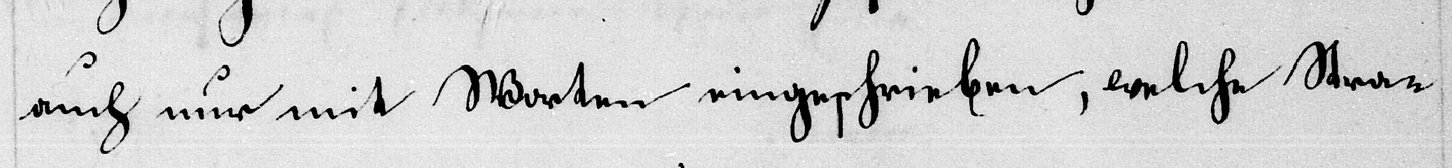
auch nur mit Worten eingeschrieben, welche Stra¬
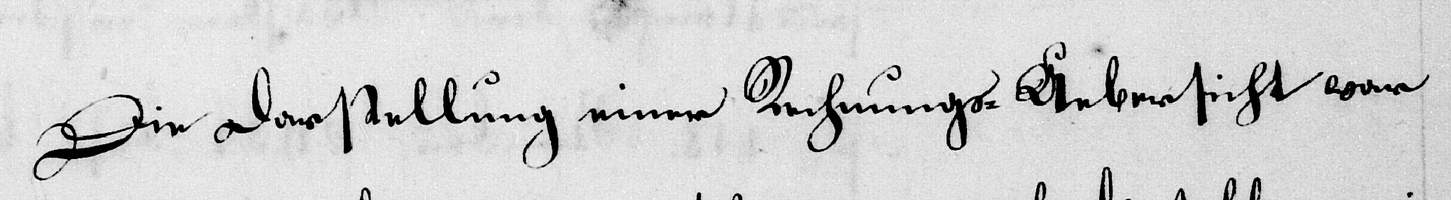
Die Darstellung einer Rechnungs-Uebersicht war
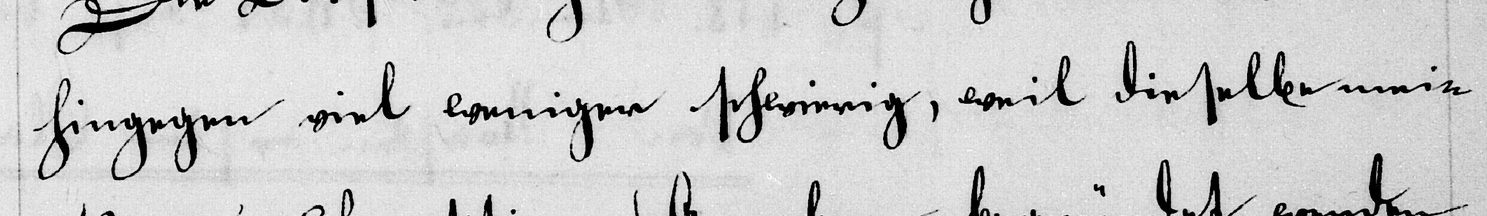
hingegen viel weniger schwierig, weil dieselbe mei¬
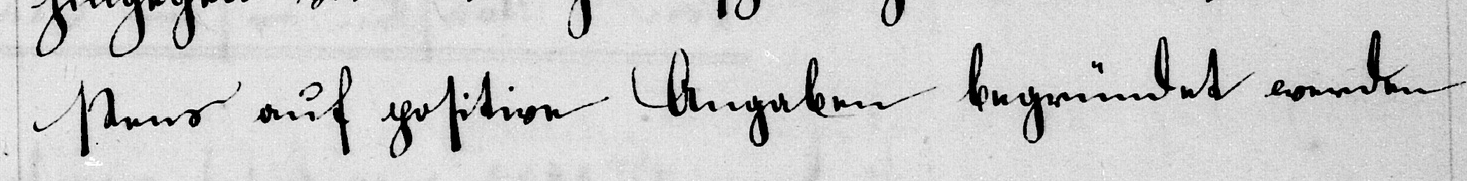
stens auf positive Angaben begründet werden
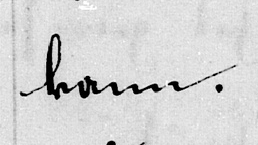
kann.
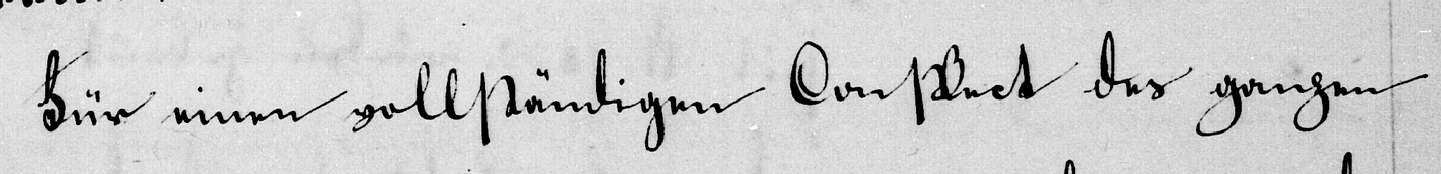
Für einen vollständigen Conspect des ganzen
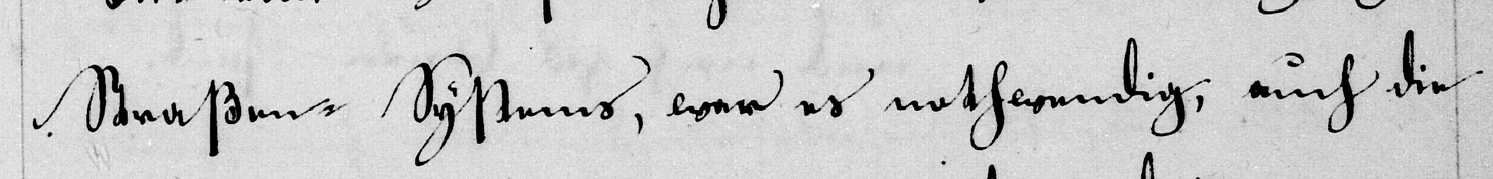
Straßen-Systems, war es nothwendig, auch die
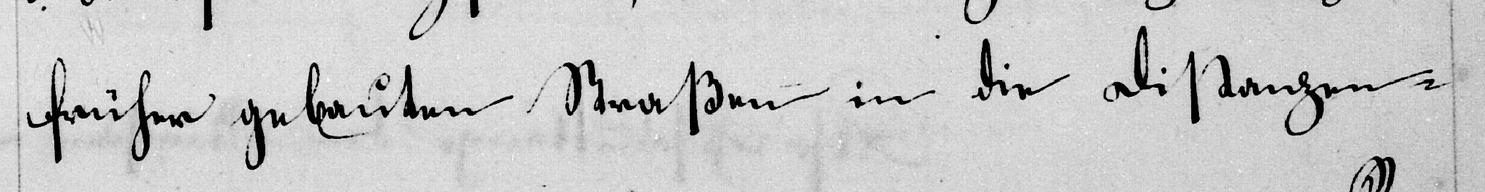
früher gebauten Straßen in die Distanzen-
